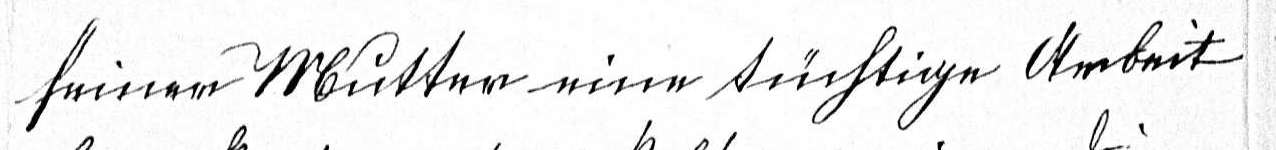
seiner Mutter eine tüchtige Arbeit¬
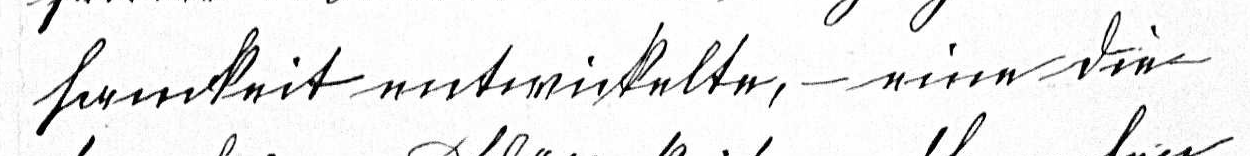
samkeit entwickelte, – eine die¬
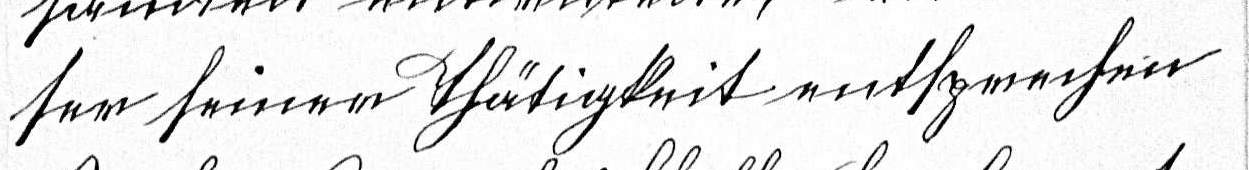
ser seiner Thätigkeit entsprechen
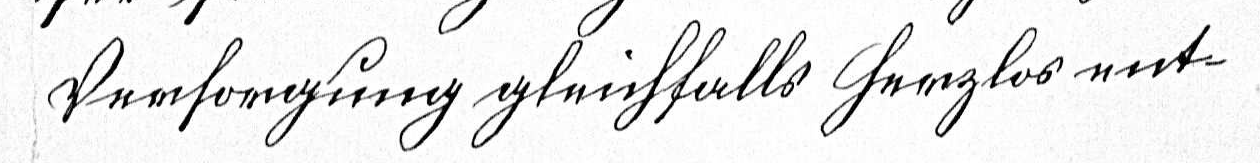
Versorgung gleichfalls herzlos ent¬
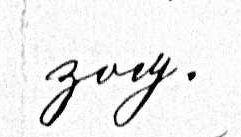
zog.
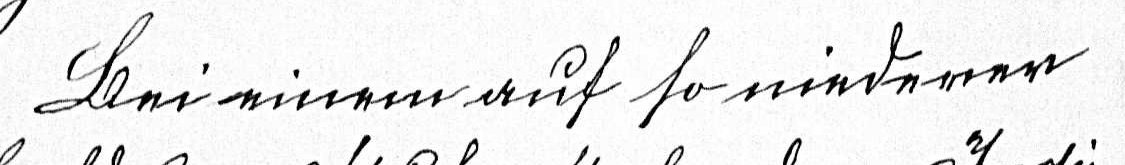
Bei einem auf so niederer
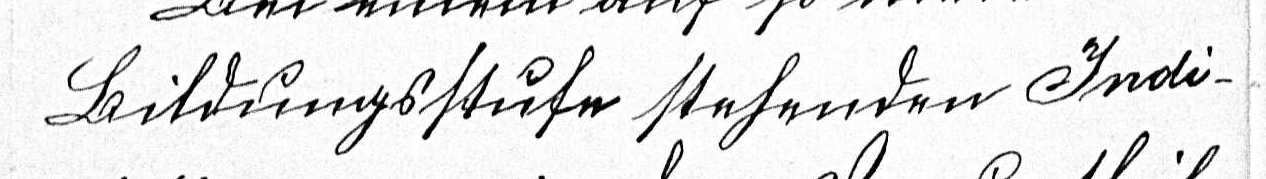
Bildungsstufe stehenden Indi¬
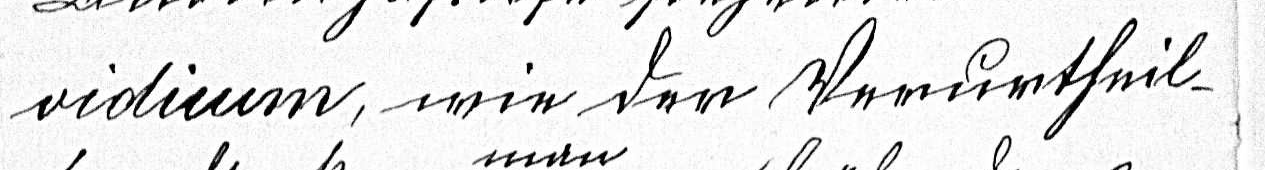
vidium, wie der Verurtheil¬
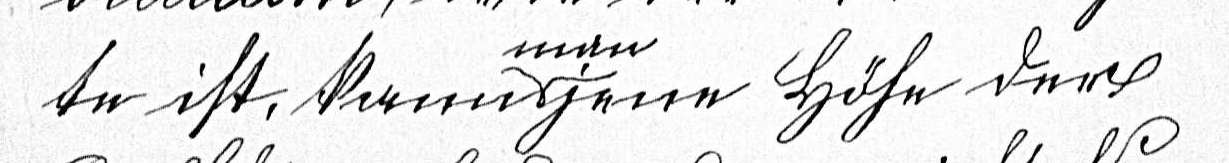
te ist, kann man jene Höhe der
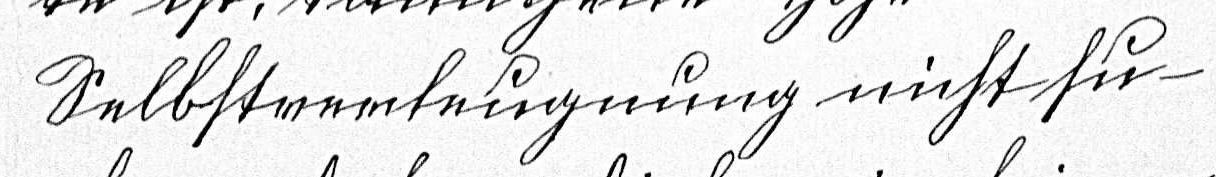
Selbstverleugnung nicht su¬
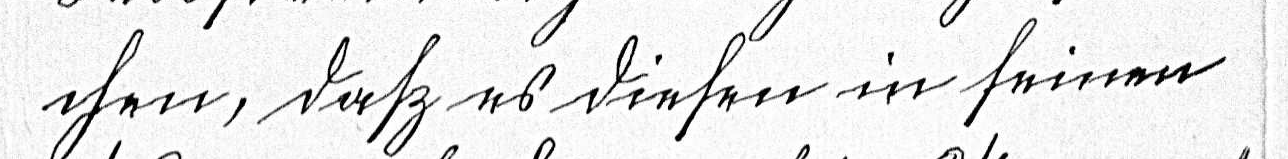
chen, daß es diesen in seinen
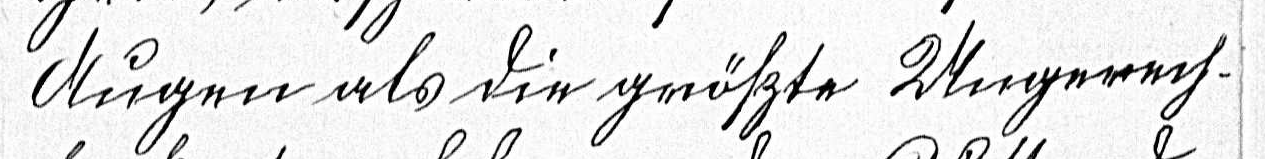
Augen als die größte Ungerech¬
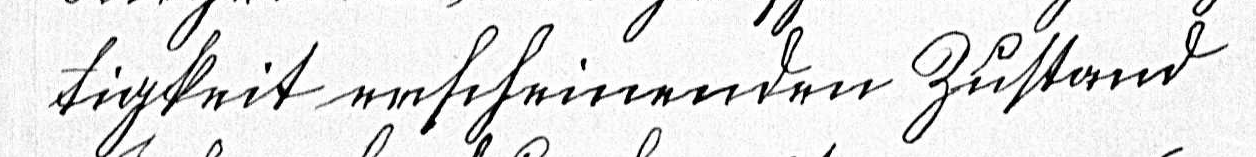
tigkeit erscheinenden Zustand
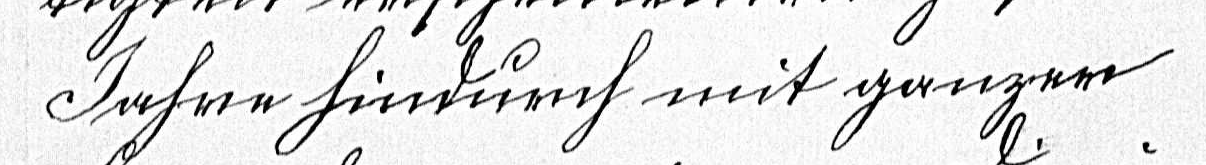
Jahre hindurch mit ganzer
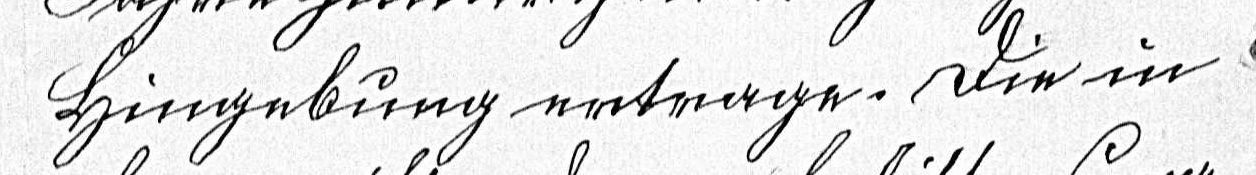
Hingebung ertrage. Die in
